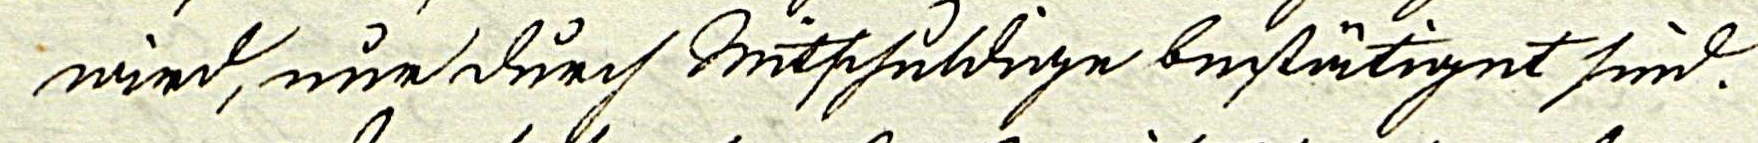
wird, nur durch Mitschuldige bestätiget sind.
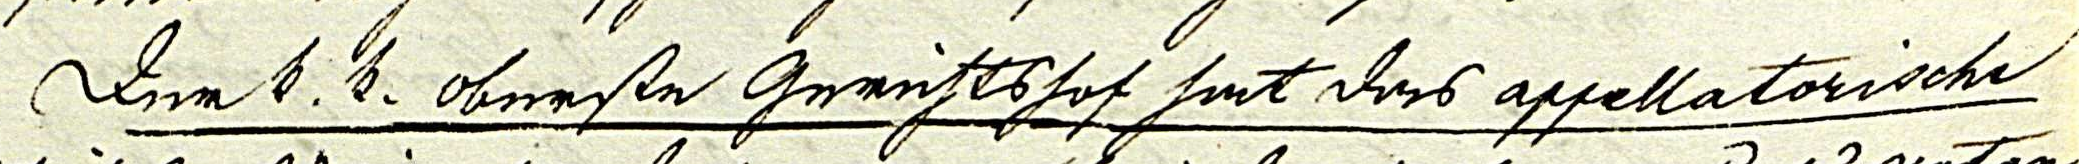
Der k.k. oberste Gerichtshof hat das appellatorische
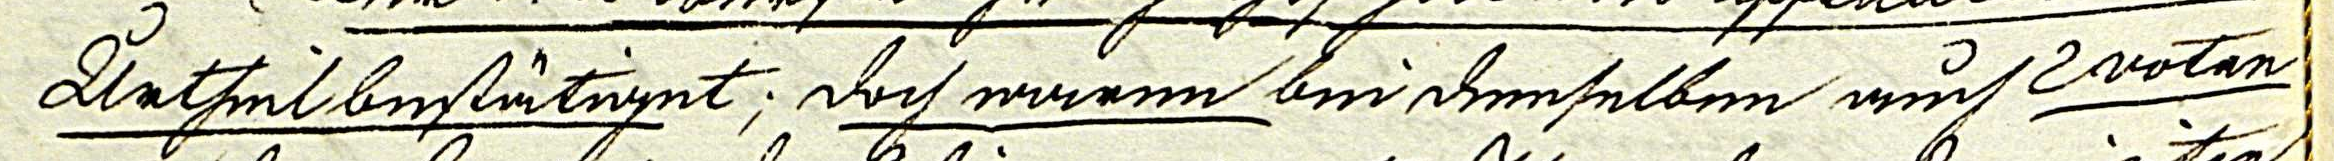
Urtheil bestätiget; doch waren bei demselben auch 2 Votan¬
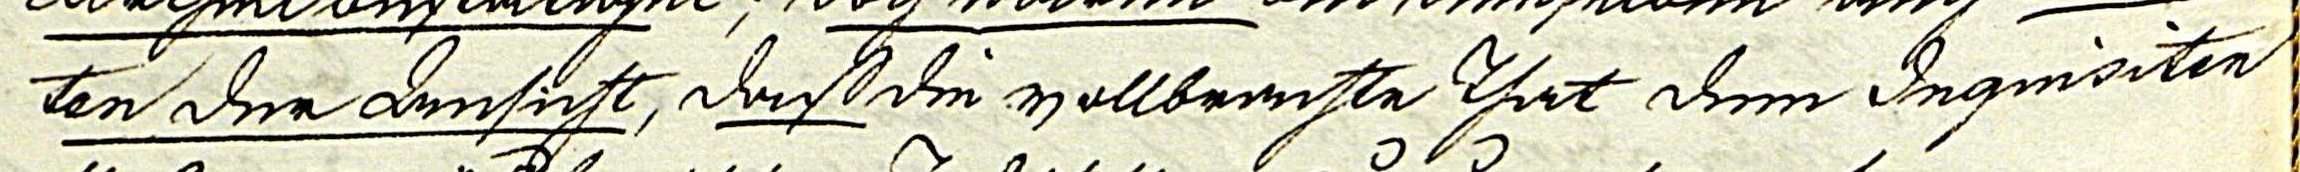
ten der Ansicht, daß die vollbrachte That dem Inquisiten
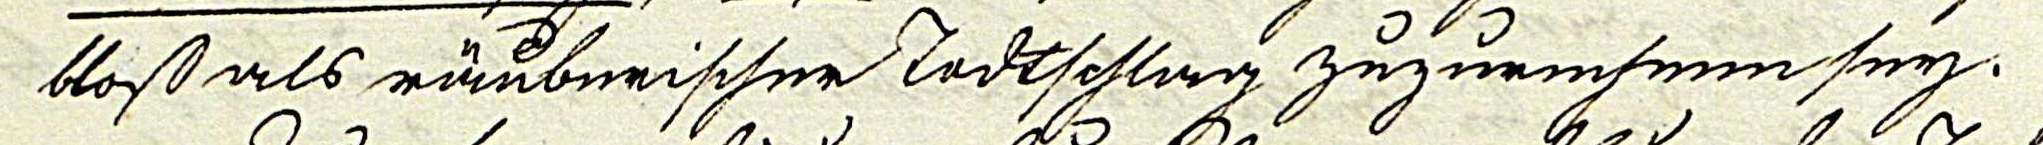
bloß als räuberischer Todtschlag zuzurechnen sey.
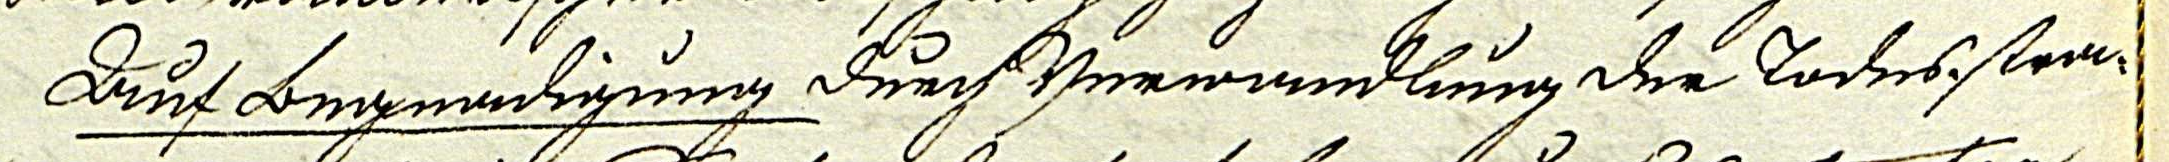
Auf Begnadigung durch Verwandlung der Todesstra¬
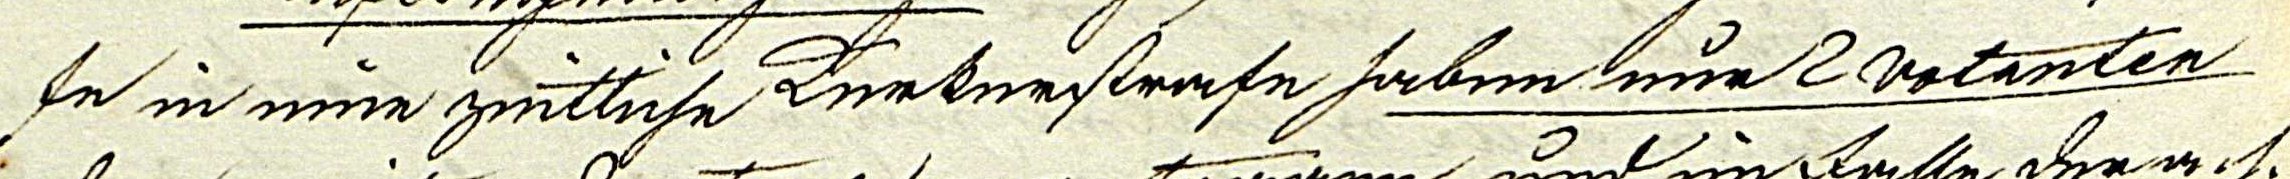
fe in eine zeitliche Kerkerstrafe haben nur 2 Votanten
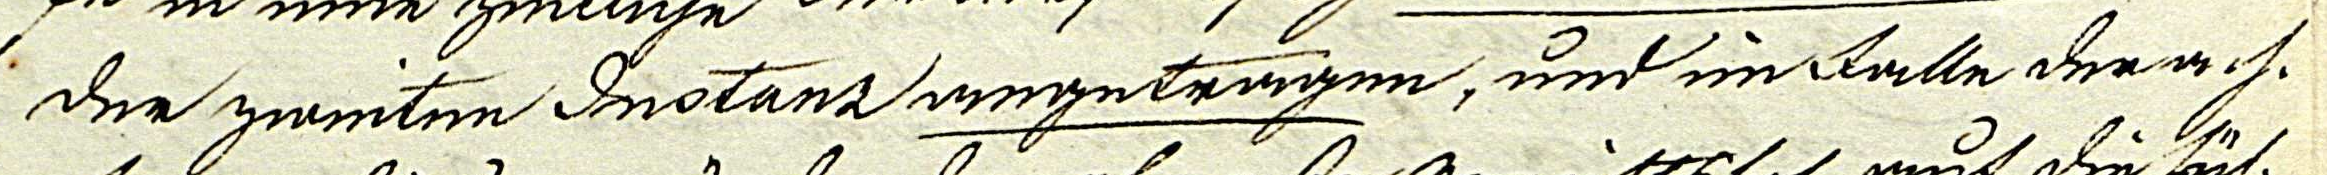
der zweiten Instanz angetragen, und im Falle der a.h.
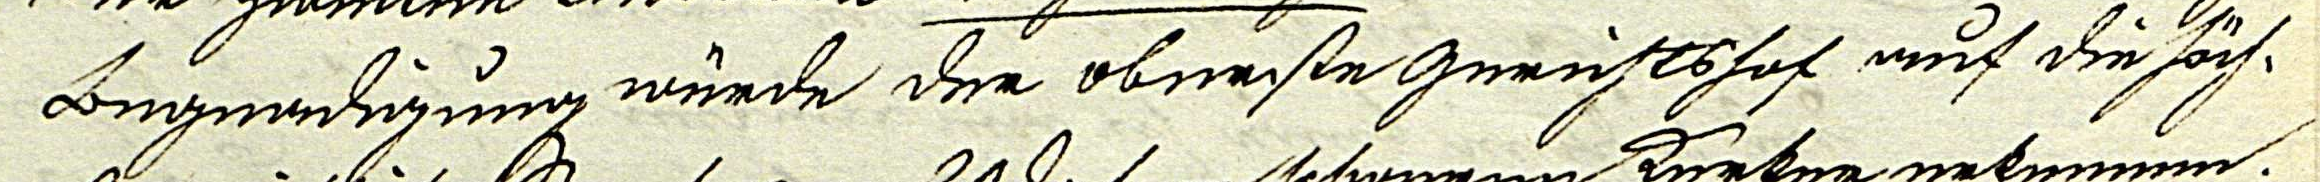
Begnadigung würde der oberste Gerichtshof auf die höch¬
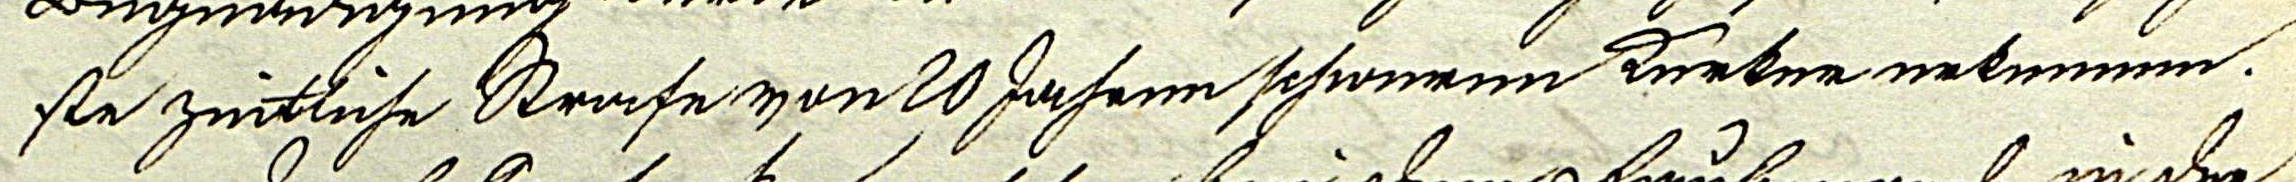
ste zeitliche Strafe von 20 Jahren schweren Kerker erkennen.
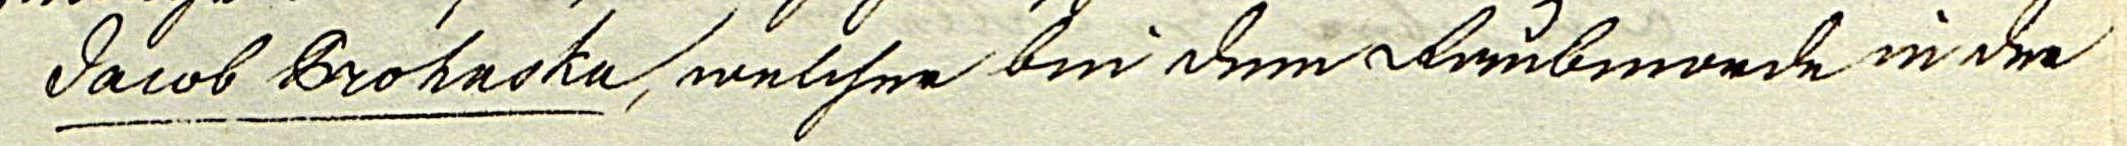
Jacob Prohaska welcher bei dem Raubmorde in der
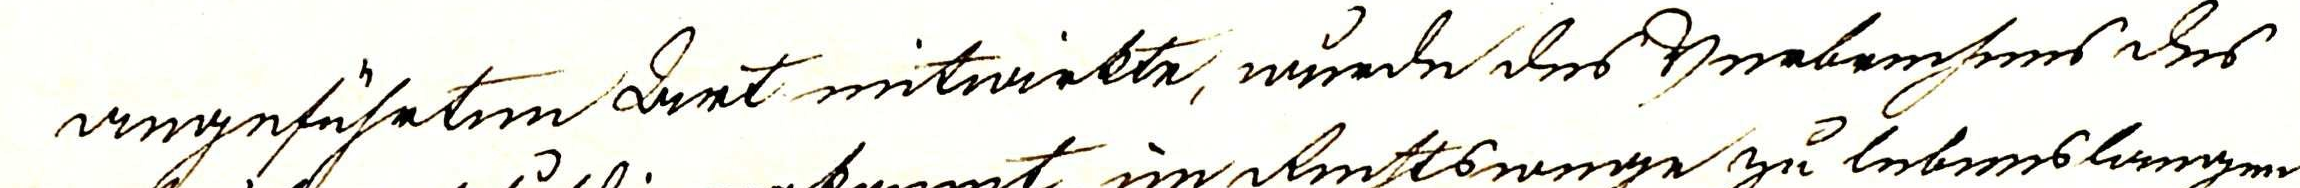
angeführten Art mitwirkte, wurde des Verbrechens des
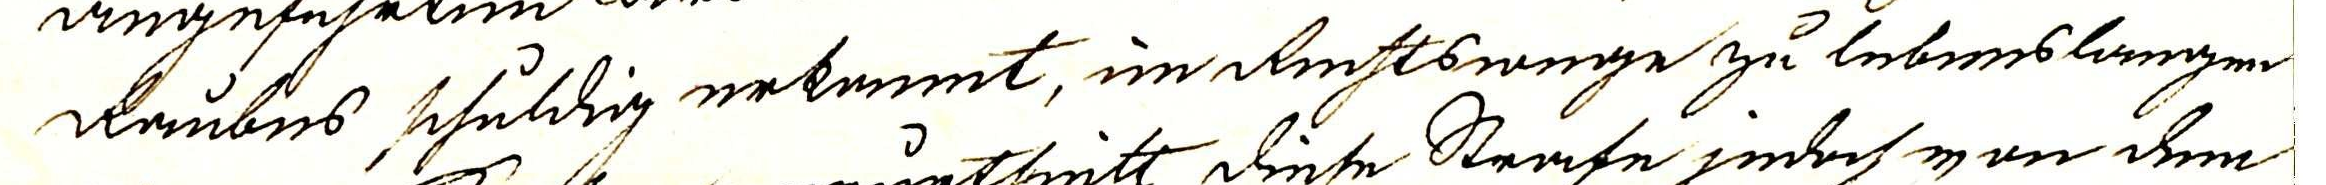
Raubes, schuldig erkannt, in Rechtswege zu lebenslangen
